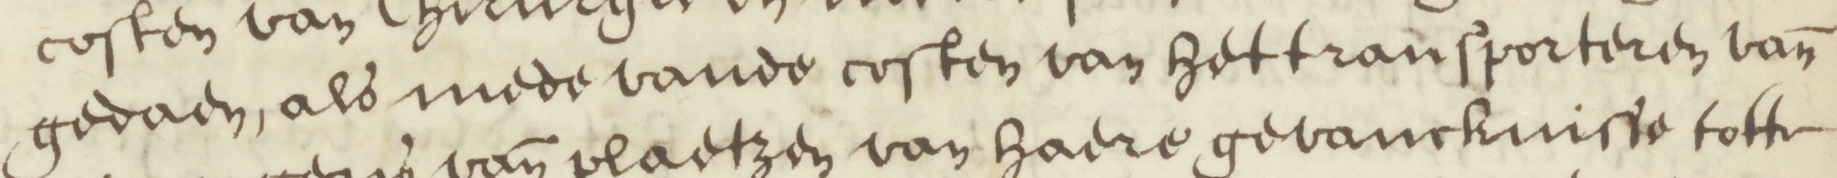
gedaen, als mede vande costen van het transporteren van
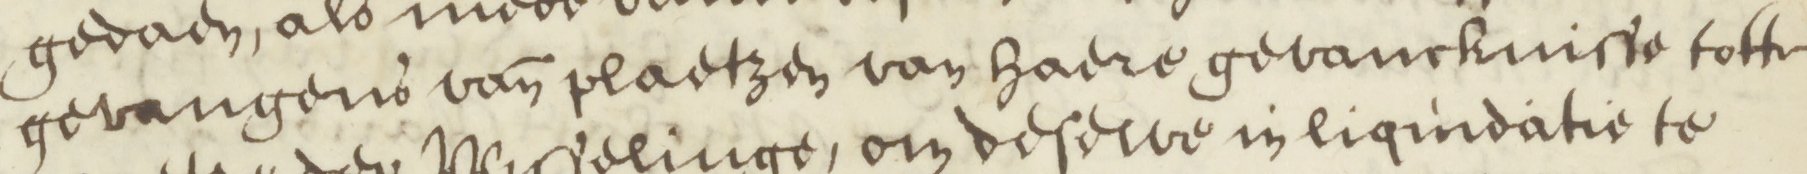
gevangens van plaetzen van haere gevancknisse totte
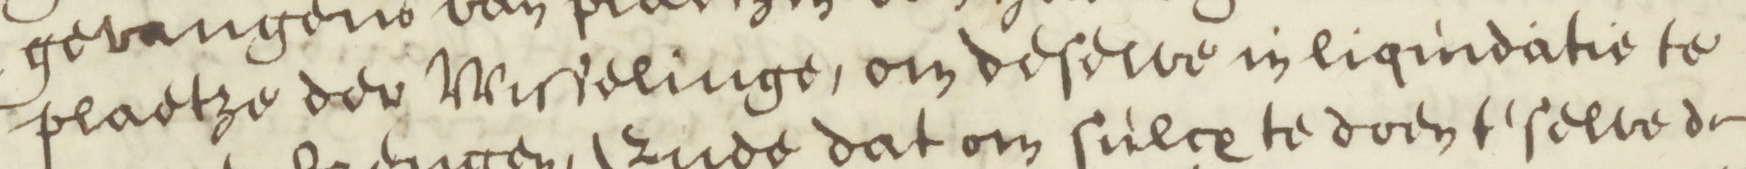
plaetze der Wisselinge om deselve in liquidatie te
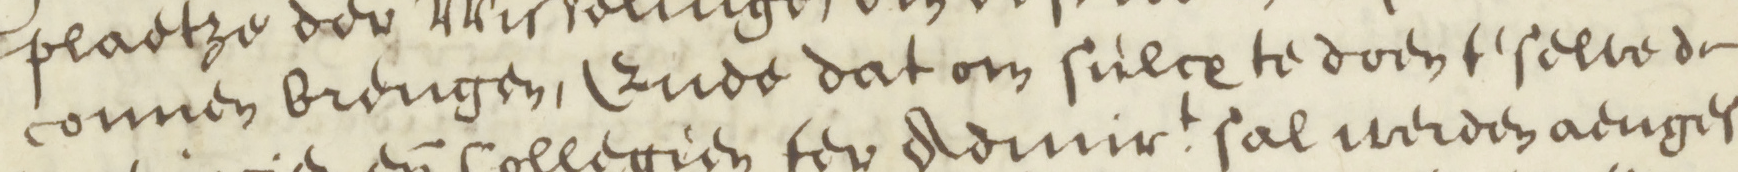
connen brengen. Ende dat om sulcx te doen 't selve de
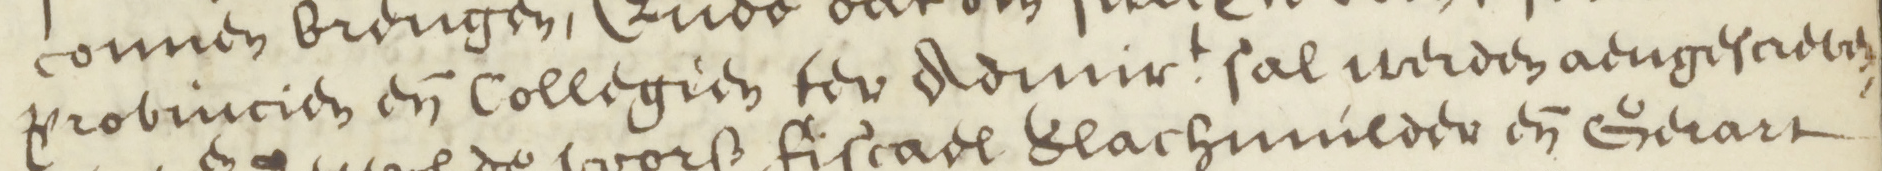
provincien en Collegien ter Admirt sal werden aengescreven.
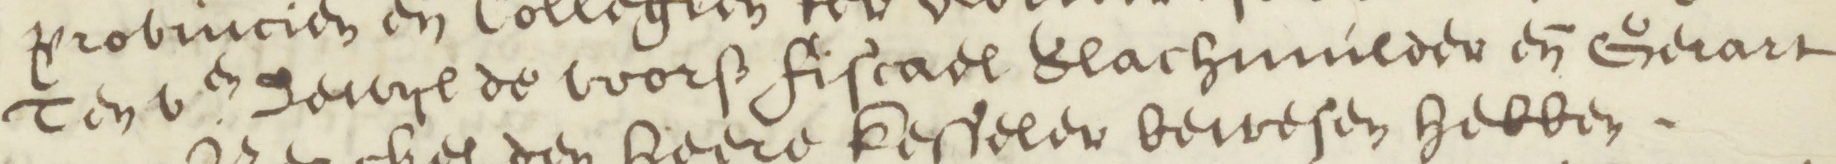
Ten ve dewyl de voors fiscael Slachmulder en Gerart
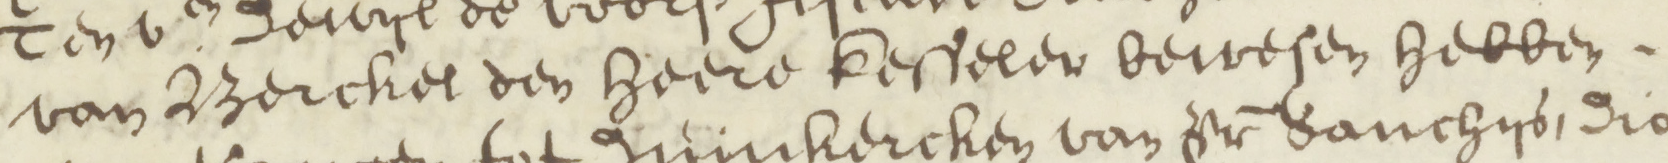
van Berckel den heere Kesseler bewesen hebben
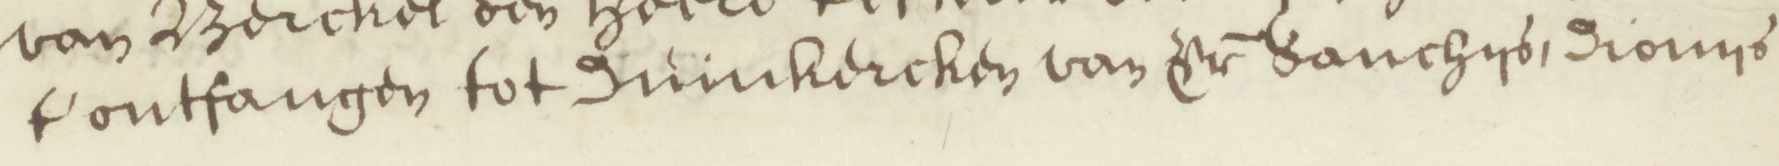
t'ontfangen tot Duinkercken van Pr Sanchys Dionys
